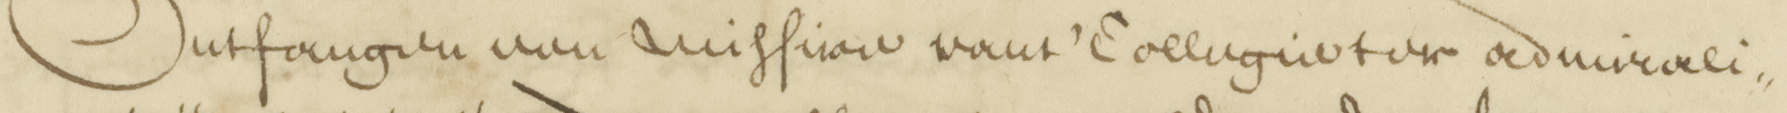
Ontfangen een missive vant' Collegie ter Admirali„
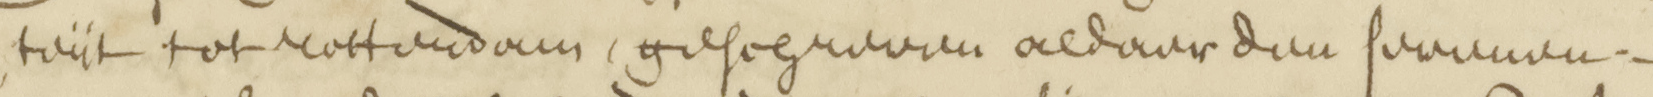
,,teijt tot Rotterdam, geschreven aldaer den sevenen„
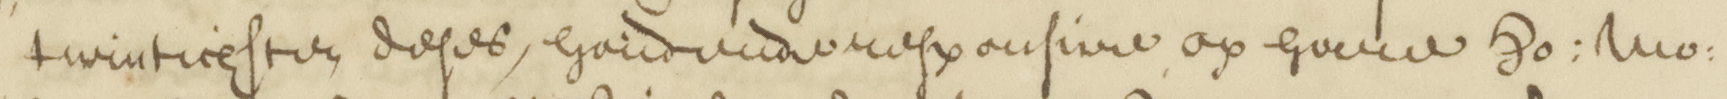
,,twintichsten deses, houdende responsive op hare Ho:Mo:
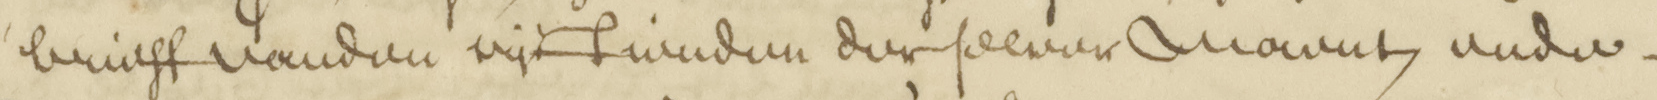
brieff vanden vijftienden der selver Maent, ende
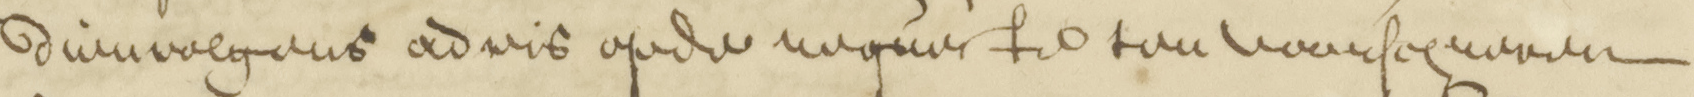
dienvolgens advis opde requeste ten voorschreven
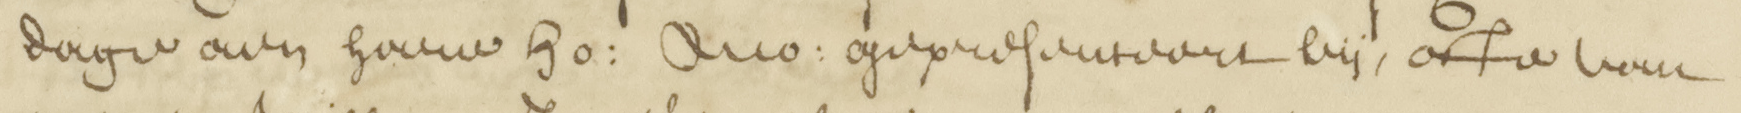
dage aen hare Ho:Mo: gepresenteert bij ofte van
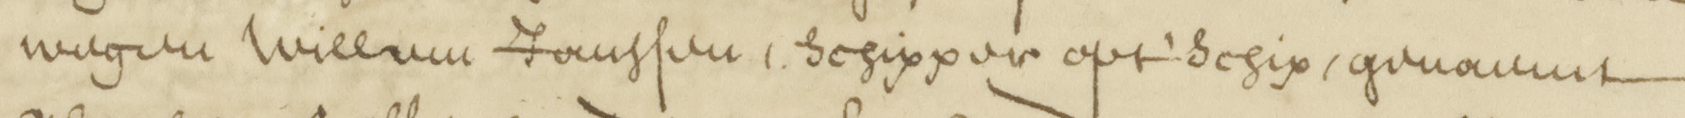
wegen Willem Janssen, schipper opt' Schip, genaemt
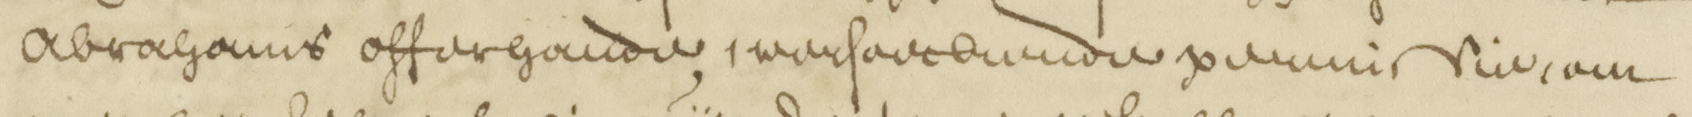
Abrahams offerhande, versoeckende permissie, om
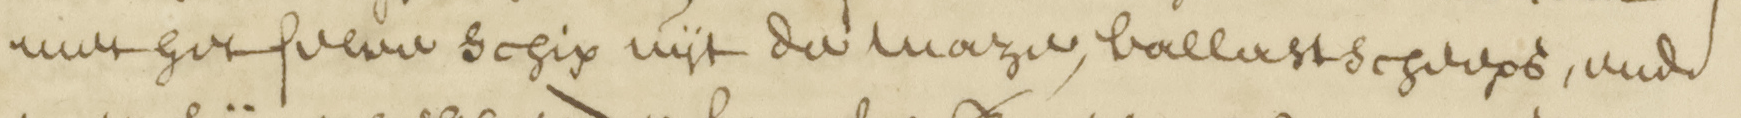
met het selve schip uijt de Maze, ballastscheeps, ende
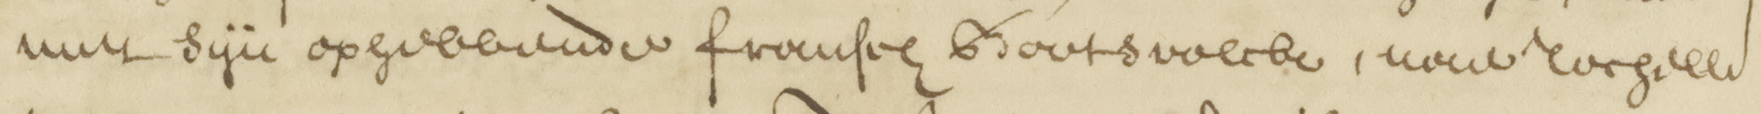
met sijn ophebbende Fransch Bootsvolck, nae Rochelle
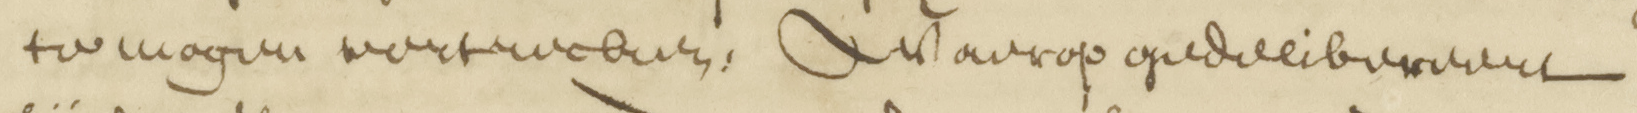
te mogen vertrecken. Waerop gedelibereert
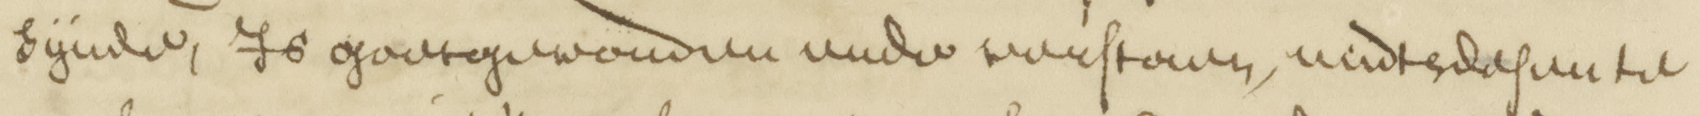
sijnde, Is goetgevonden ende verstaen, midtsdesen te
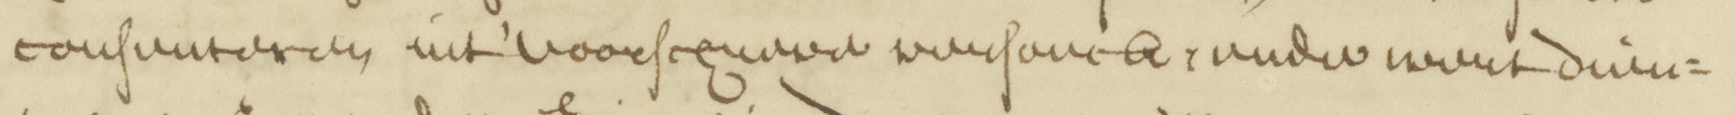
consenteren int' voorschreve versoeck, ende wert dien=
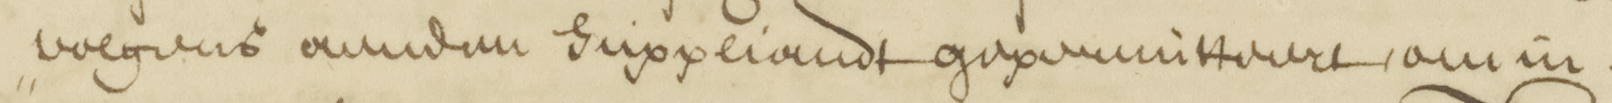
,,volgens aenden Suppliandt gepermitteert, om in
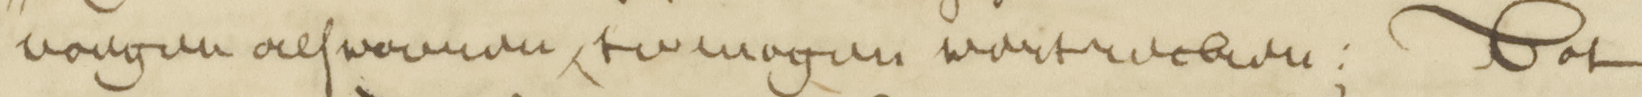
voegen alsvoeren, te mogen vertrecken: Tot
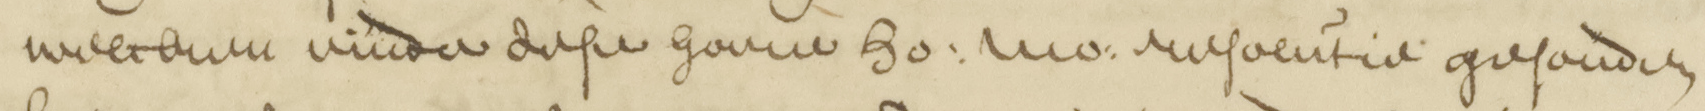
welcken einde dese hare Ho:Mo: resolutie gesonden
